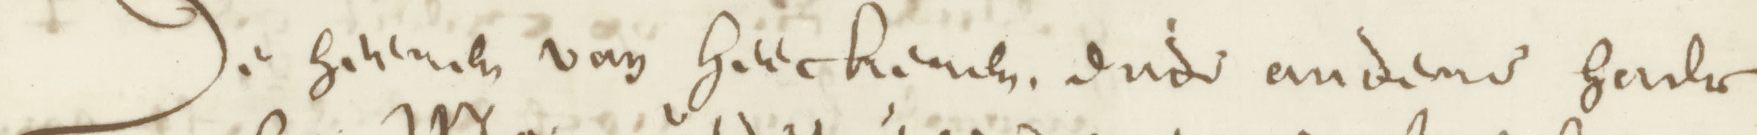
De heeren van heeckeren, ende andere haer
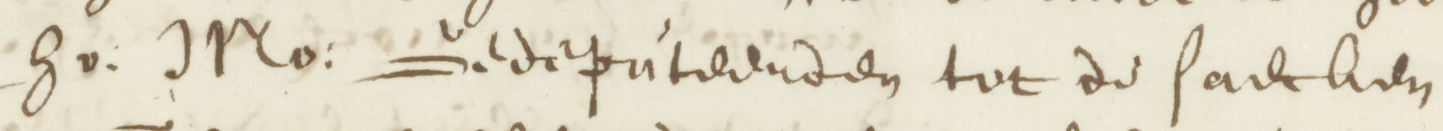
ho:Mo: Gedeputeerden tot de saecken
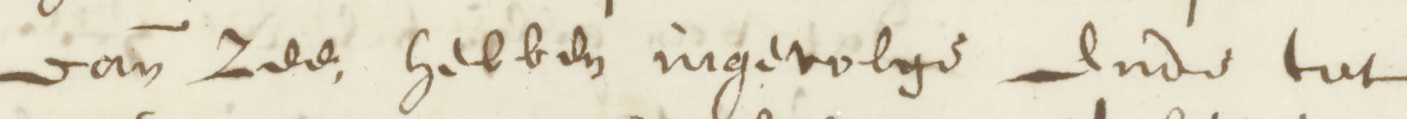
van Zee, hebben ingevolge ende tot
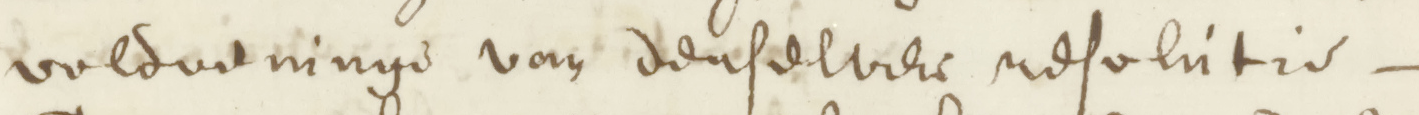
voldoeninge van derselver resolutie
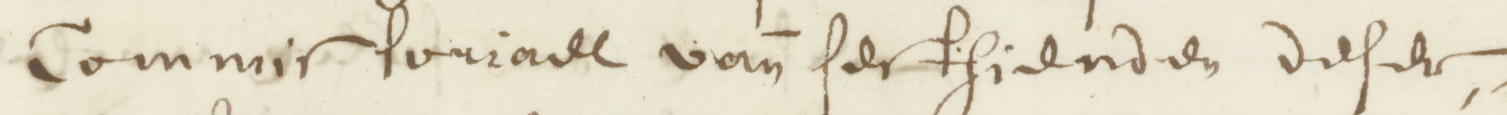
Commissoriael van sesthienden deser,
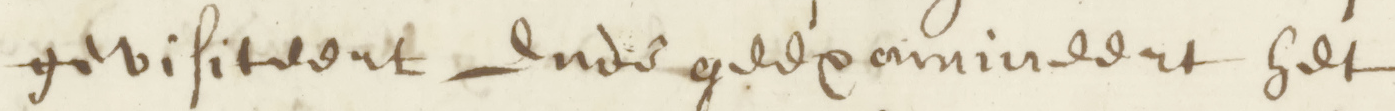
gevisiteert Ende geexamineert het
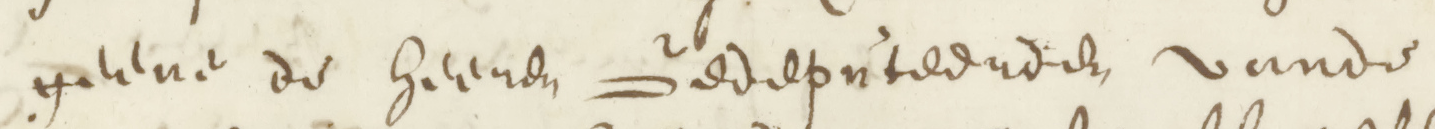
geene de heeren Gedeputeerden vande
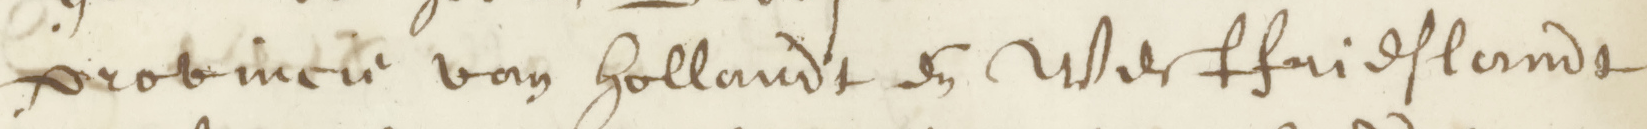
provincie van hollandt en Westfrieslandt
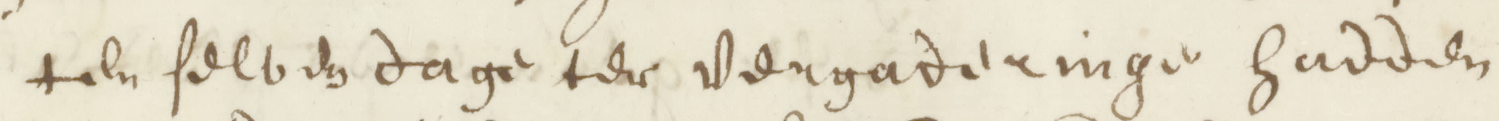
ten selven dage ter Vergaderinge hadden
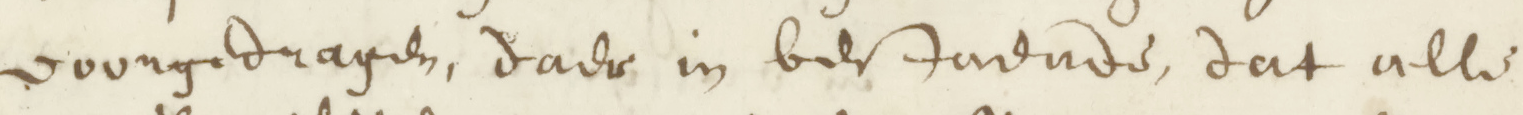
voorgedragen, daer in bestaende, dat alle
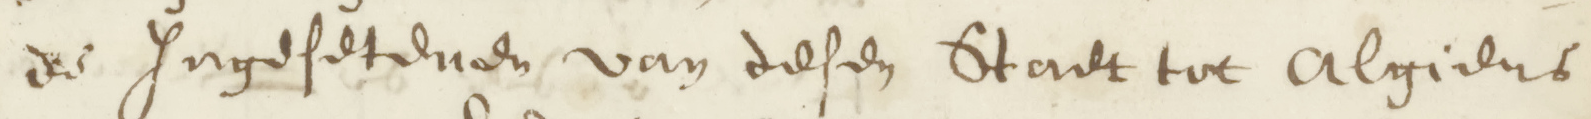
de Ingesetenen van desen Staet tot Algiers
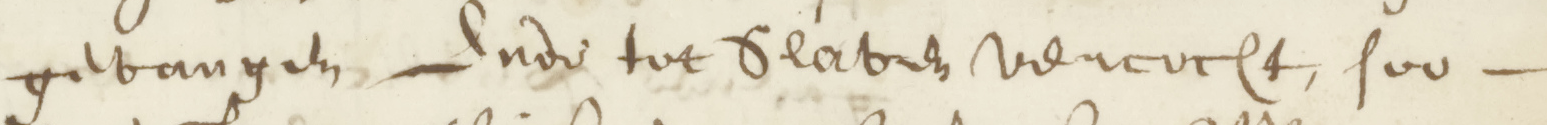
gevangen Ende tot Slaven vercocht, soo -
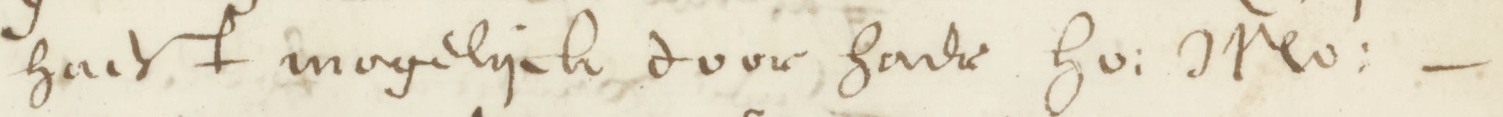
haest mogelijck door haer ho:Mo: —
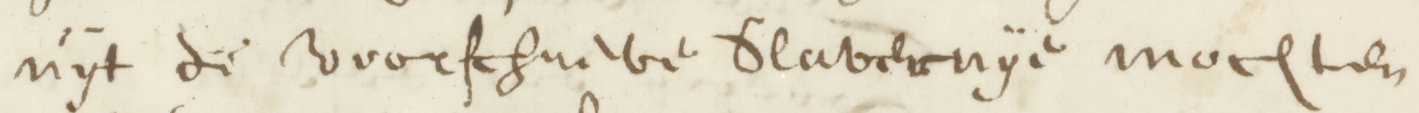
uijt de voorschreve Slavernije mochten
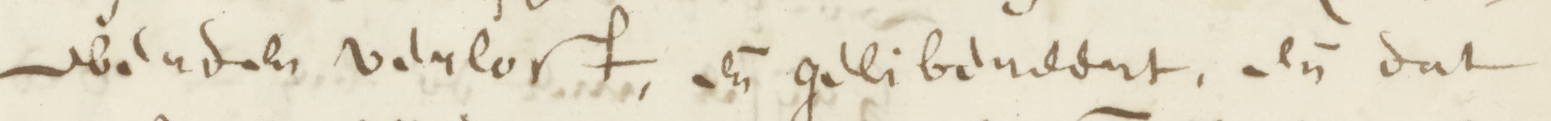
werden verlost, en gelibereert, en dat
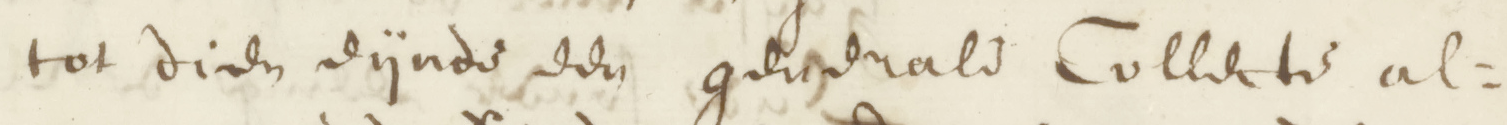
tot dien eijnde een generale Collecte al=
